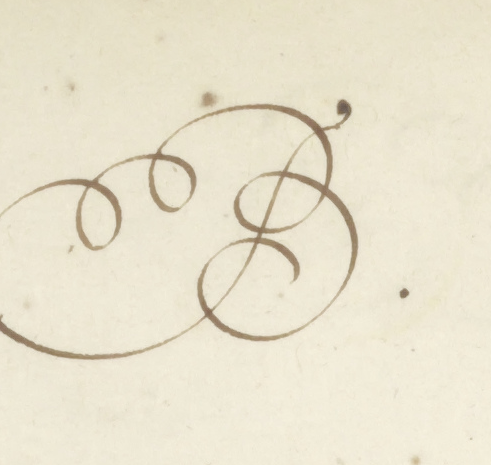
B.
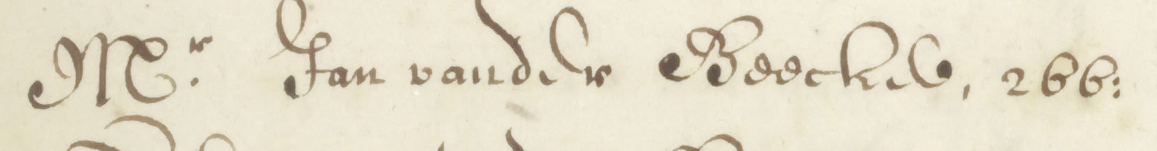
Mr. Jan vander Beecke, 266:
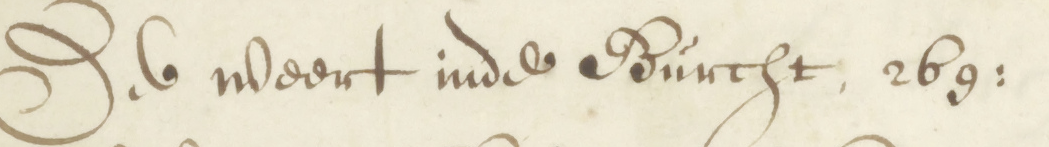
De weert inde Burcht, 269:
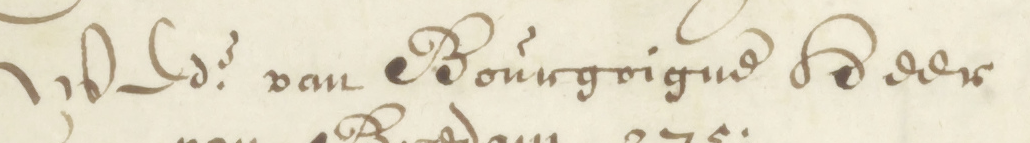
Wede. van Bourgoigne Heer
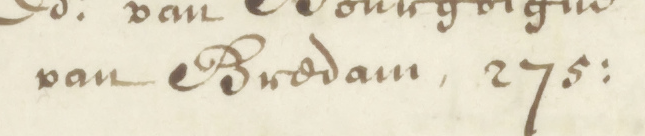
van Bredam, 275:
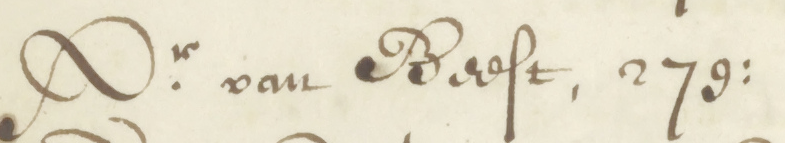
Pr. van Beest, 279:
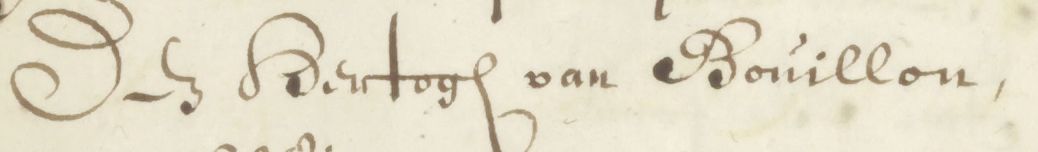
Den Hertogh van Bouillon,
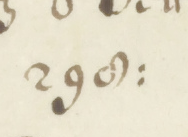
298:
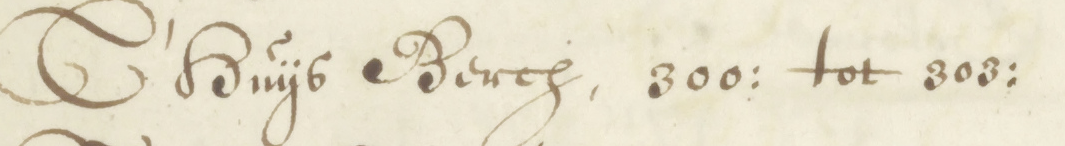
T‛Huijs Berch, 300: tot 303:
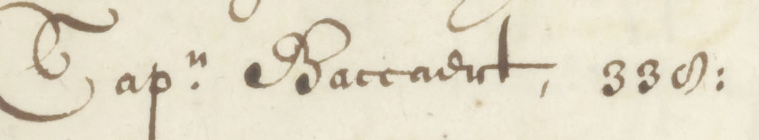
Capn. Baccaert, 338:
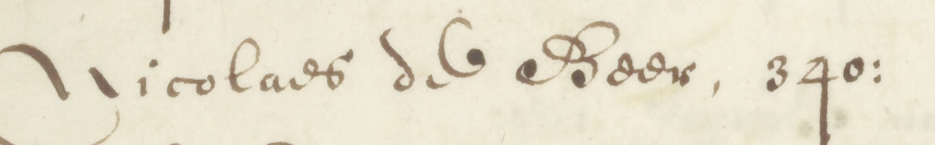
Nicolaes de Beer, 340:
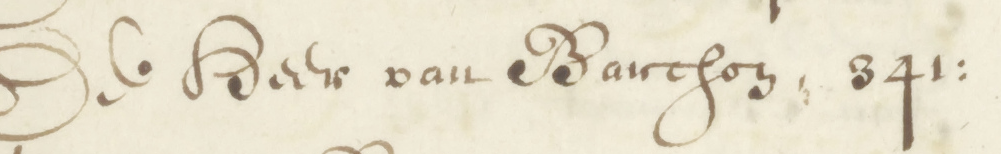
De Heer van Barchon, 341:
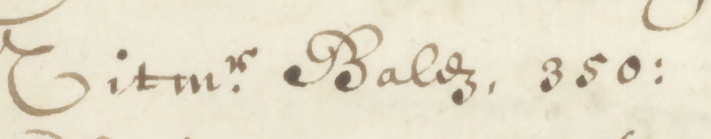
Ritmr. Balen, 350:
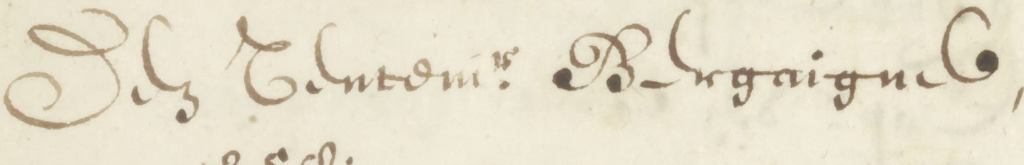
Den Rentemr. Bergaigne,
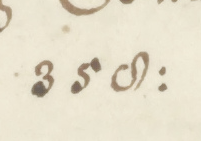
358:
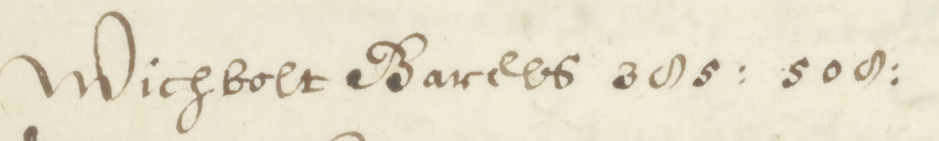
Wichbolt Barels 385: 508:
